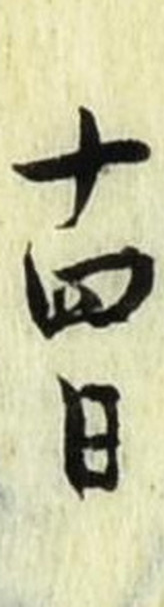十四日
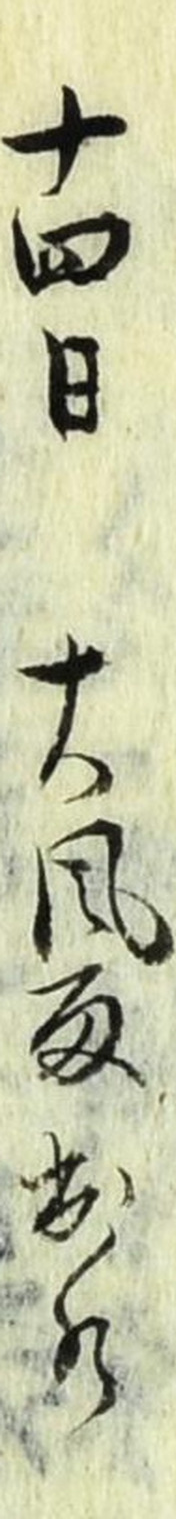十四日大風雨出水
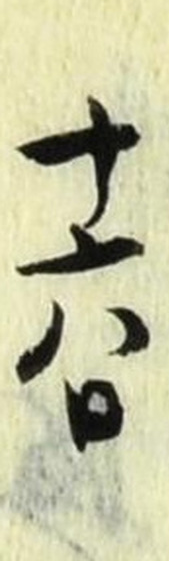十四日
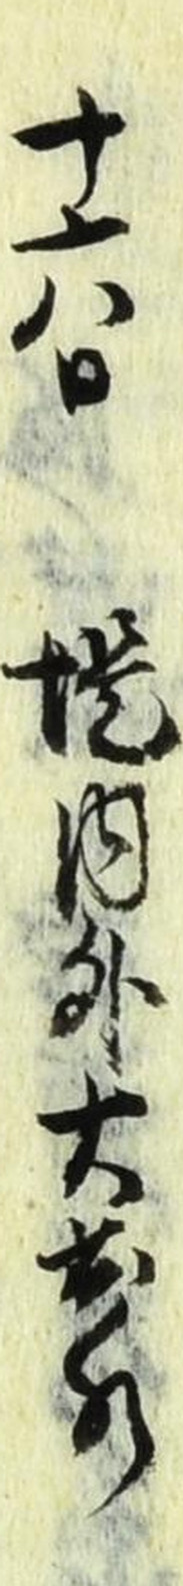十六日堤内外大出水
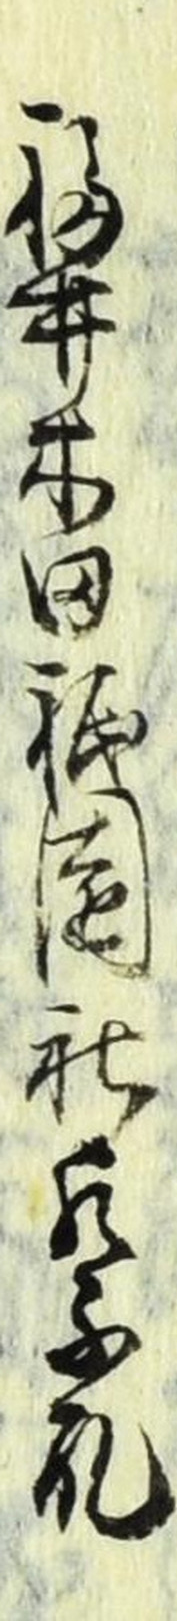福井木田祇園社祭礼
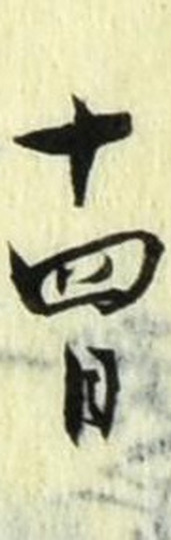十四日
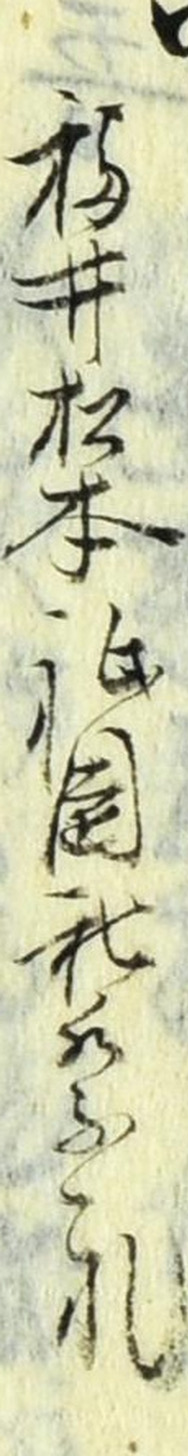福井松本祇園社祭礼

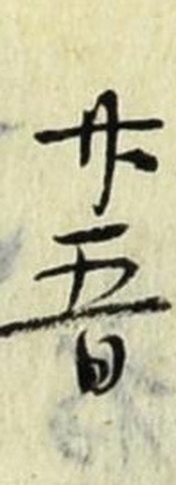廿五日
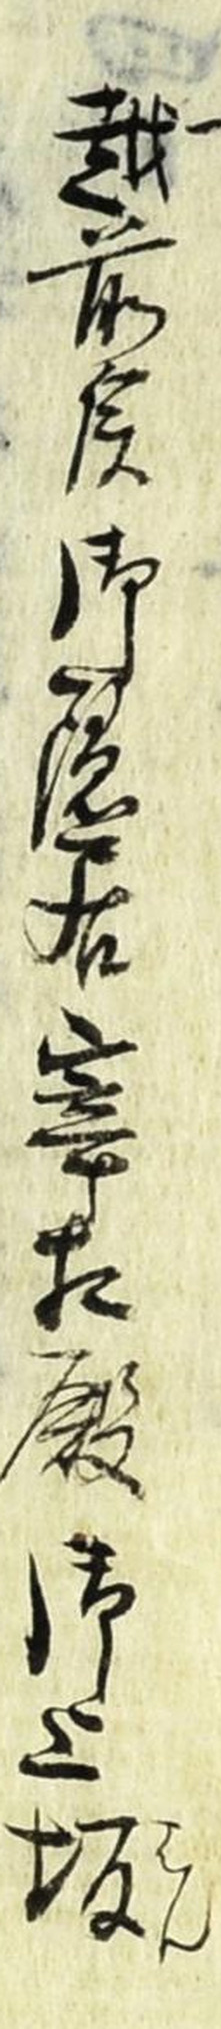越前侯御隠居宰相殿御上坂
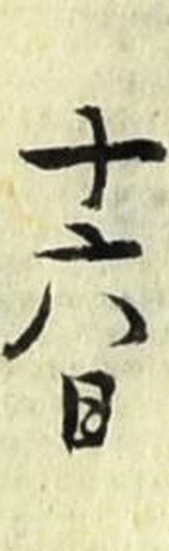十六日
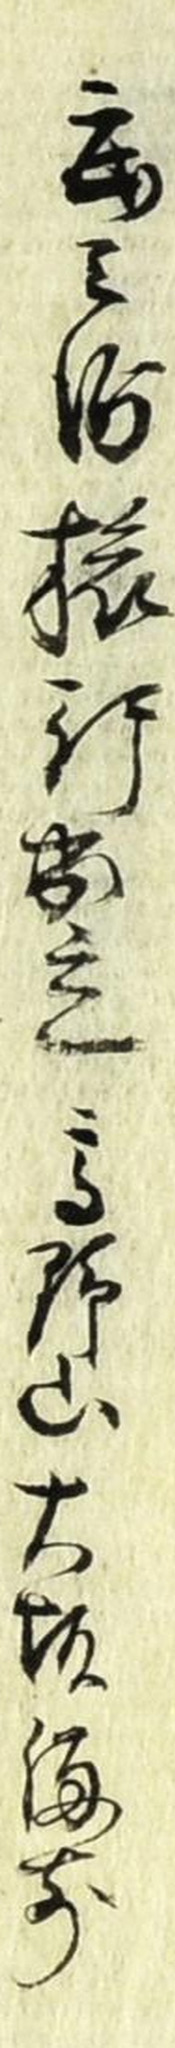武兵衛旅行出立高野山大坂備前
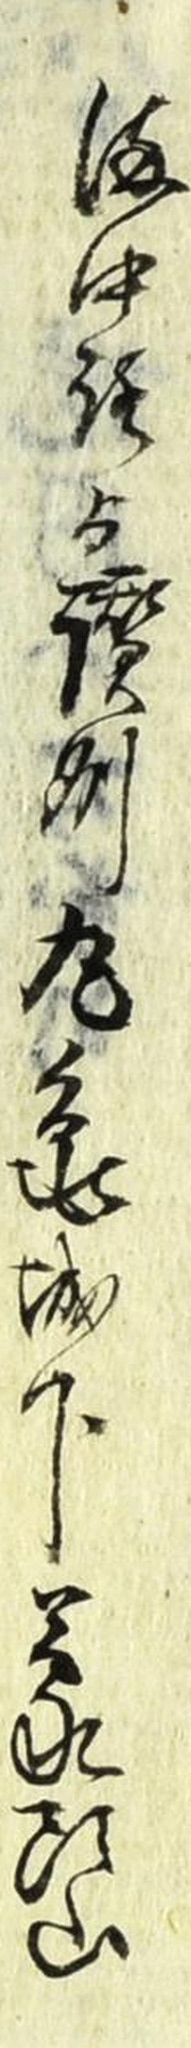備中路ゟ讃州丸亀城下象頭山
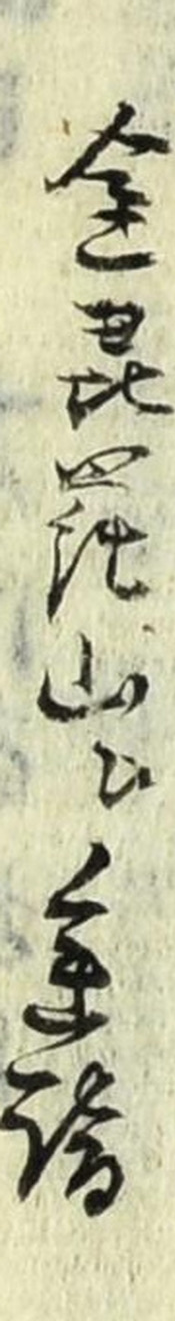金毘羅山江参詣
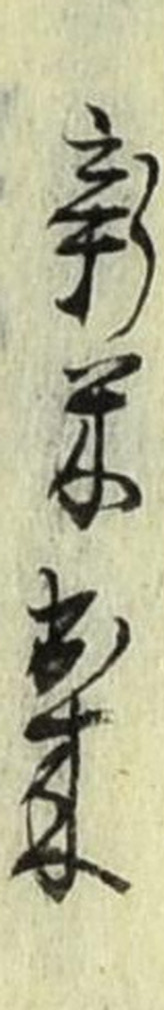新米出来
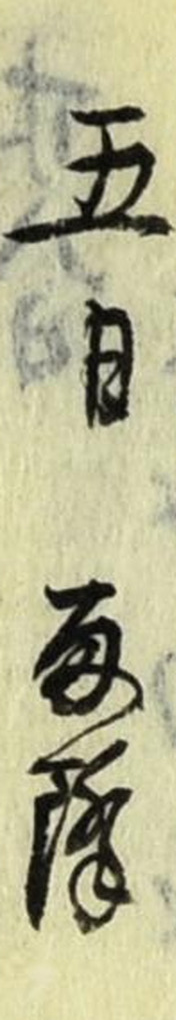五日雨降
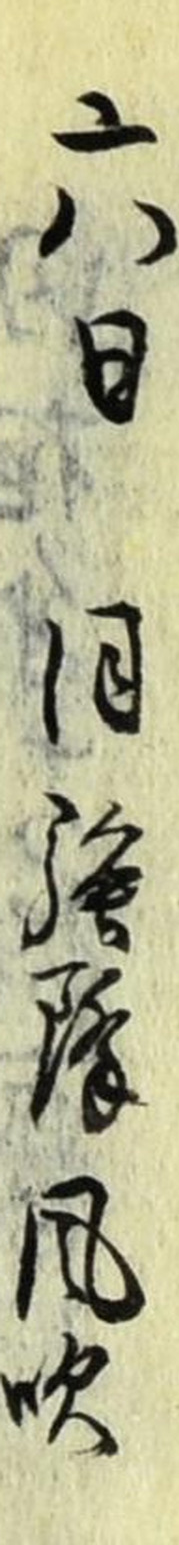六日同強降風吹
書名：（日記）
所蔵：福井県文書館 Fukui Prefectural Archives
